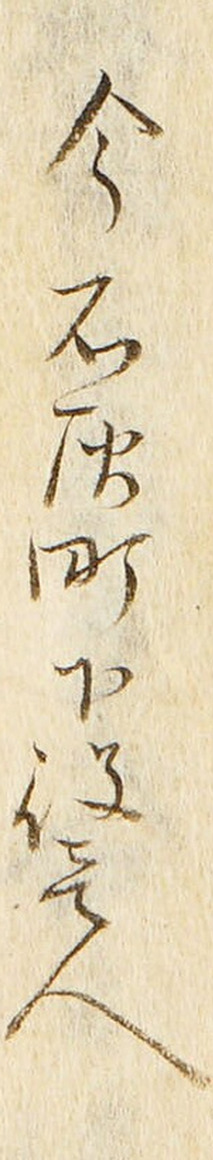今石灰町下役壱人
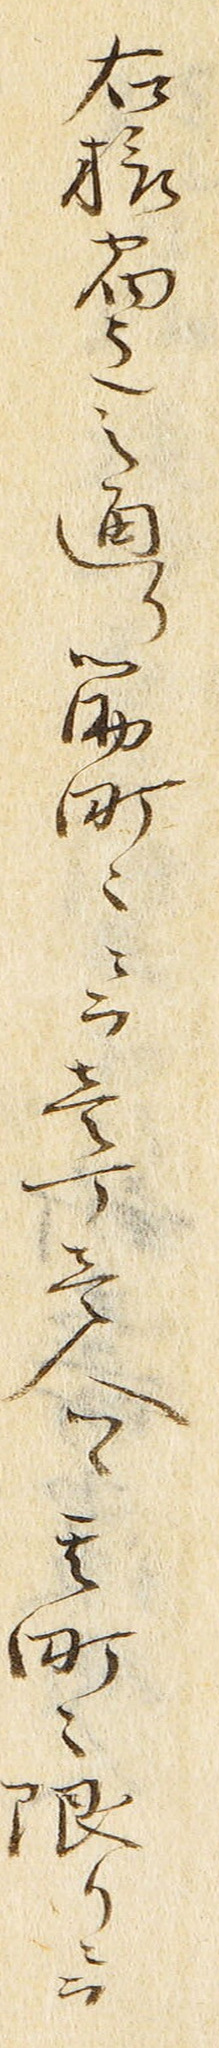右旅宿迠之通り筋町々に而壱丁壱人ツツ其町に限りに而
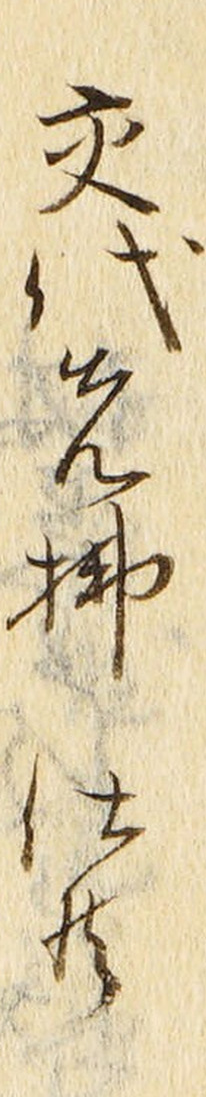交代先払仕候
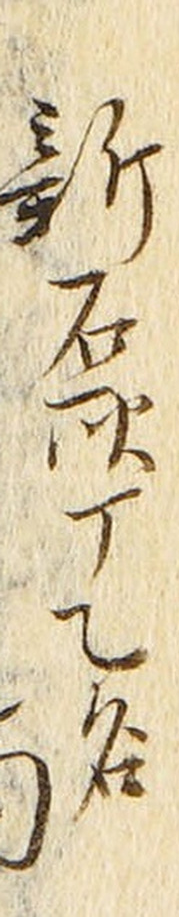新石灰町丁乙名
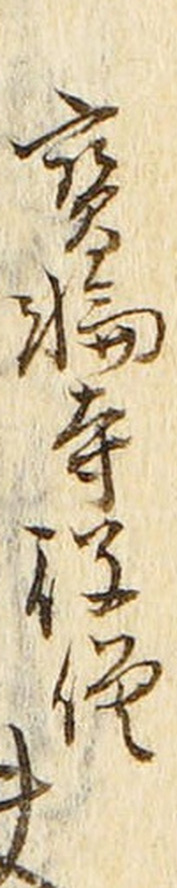宝輪寺役僧
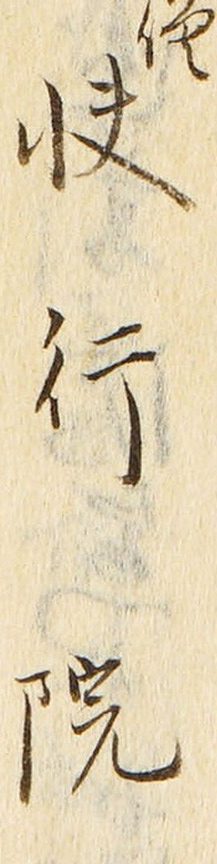快行院
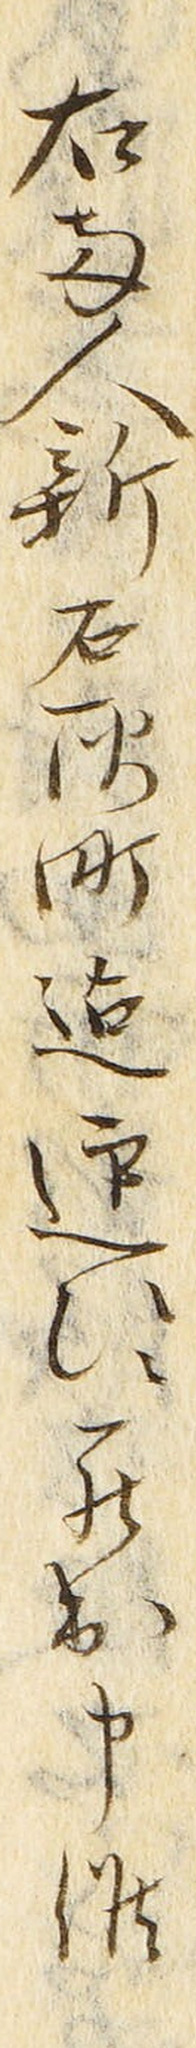右両人新石灰町迠迎ひに罷出申候
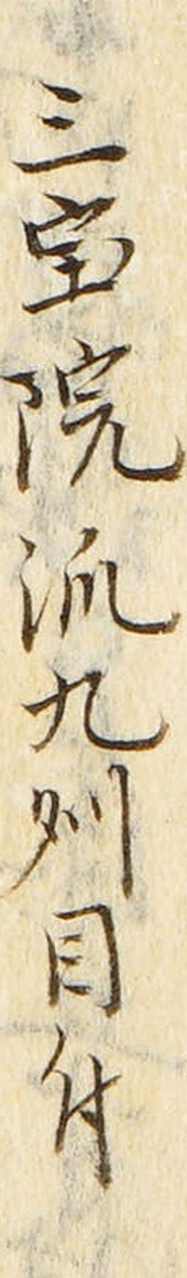三宝院派九州目付
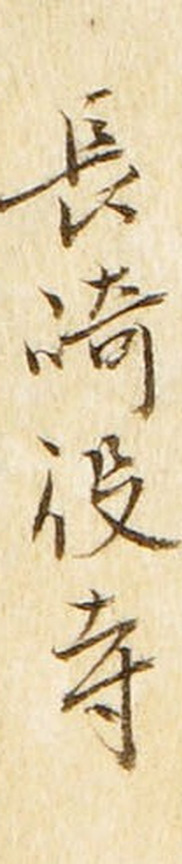長崎役寺
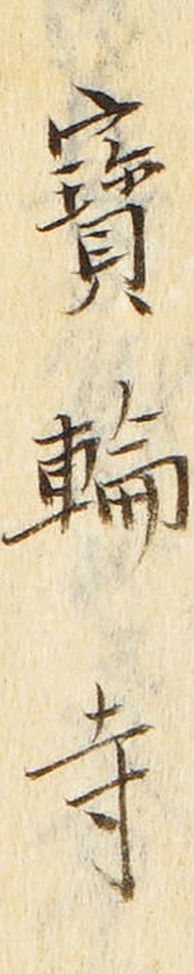宝輪寺
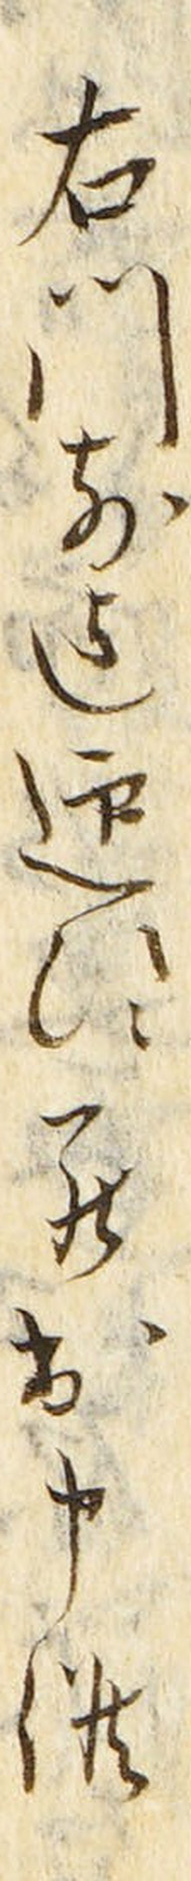右門前迄迎ひ罷出申候
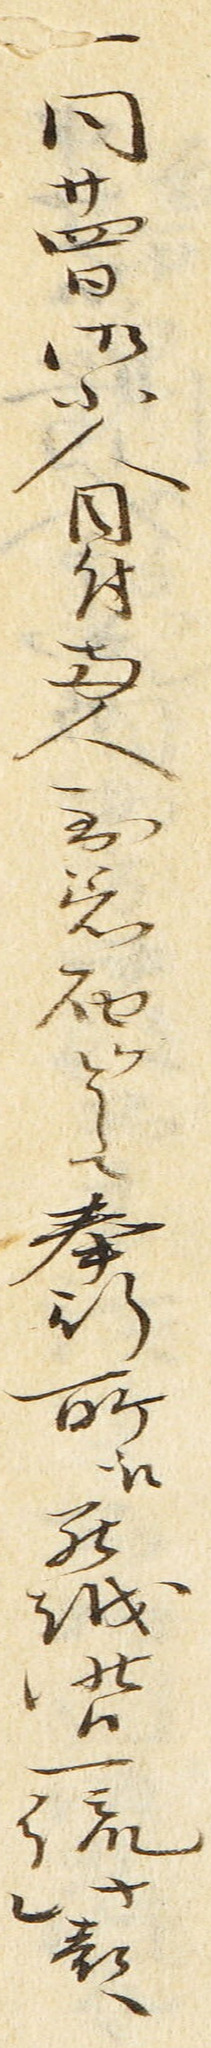同廿四日御小人目付両人至着届ケとして奉行所江罷越？候一統此趣へ
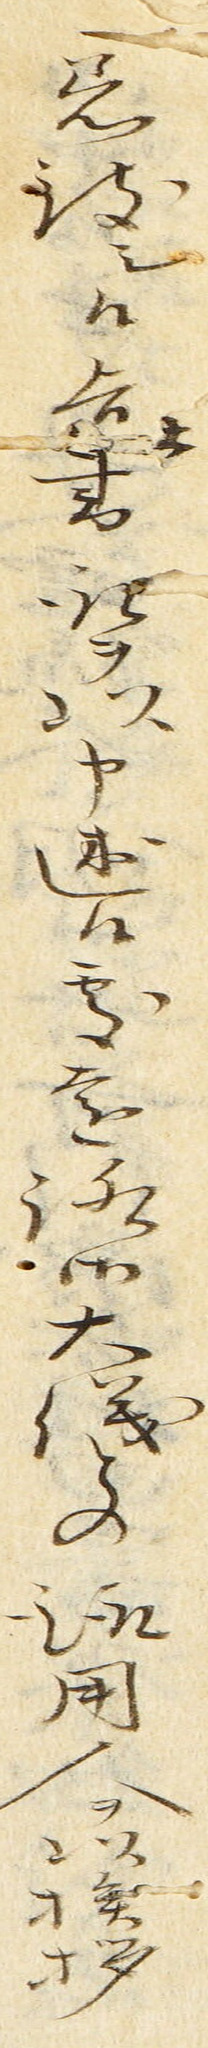着致し候旨？書取ヲ以申述候處遠路御大儀との趣用人ヲ以挨拶

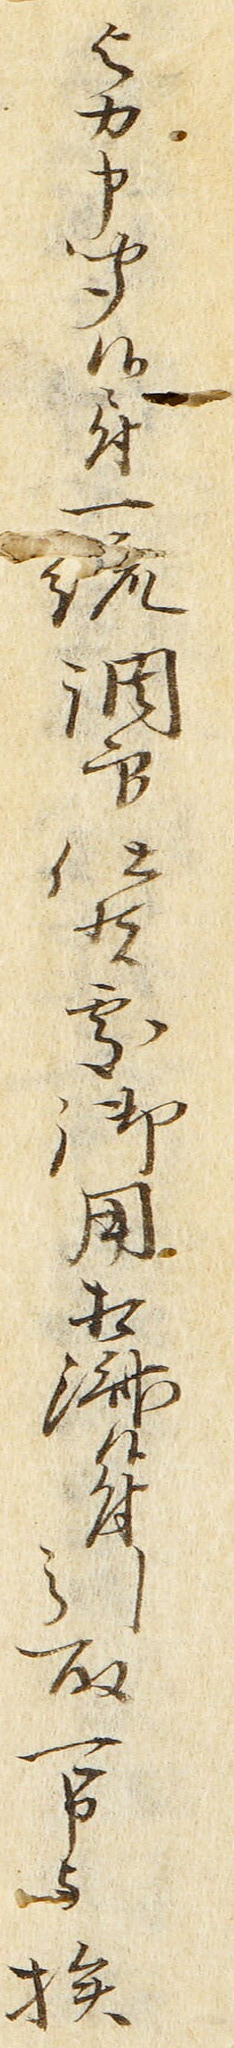と為申聞候に付一統調印仕候處御用相済候に付引取可申と挨
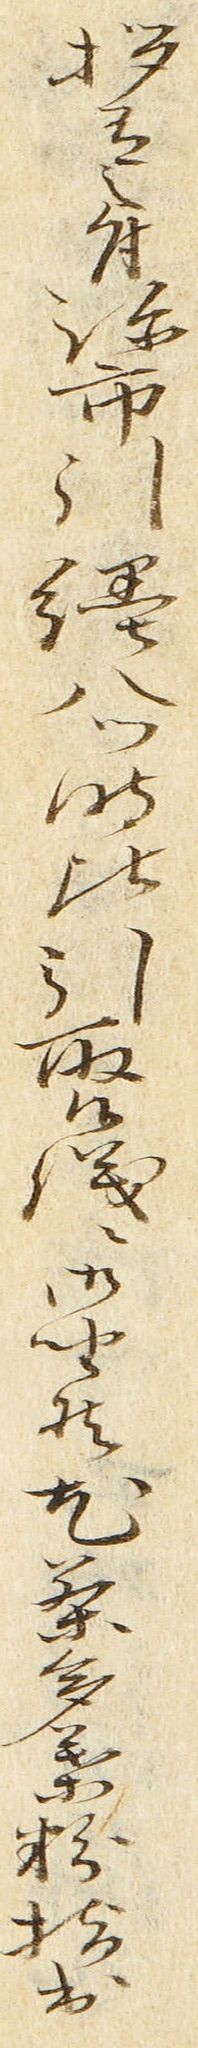拶有之付弥市引纆八ツ時頃引取候儀に御座候尤茶多葉粉指出
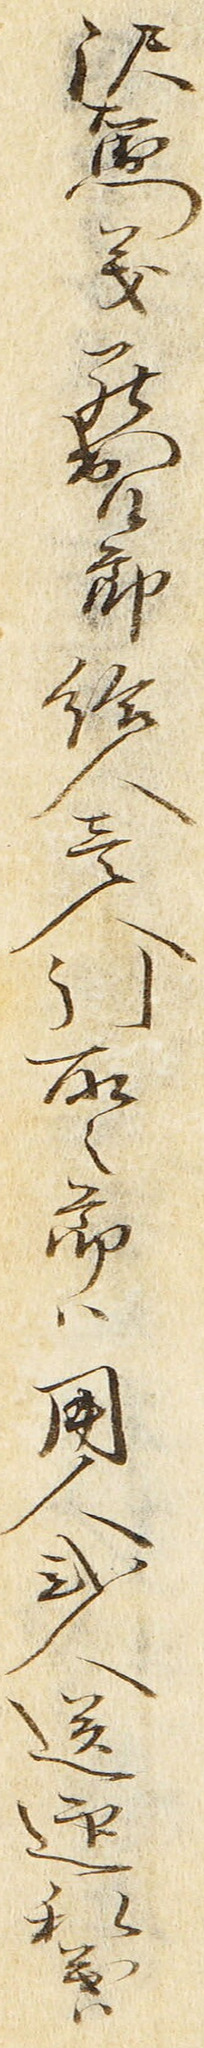沢右衛門義罷出候節給人壱人引取之節は用人弐人送迎私義は
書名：長崎漂流記
